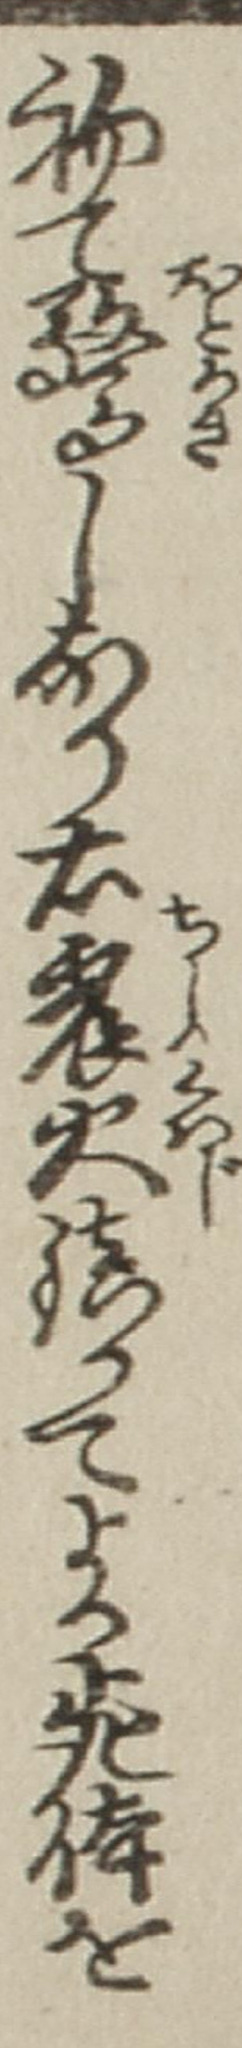初て驚しなり右震火鎮つてより死体を
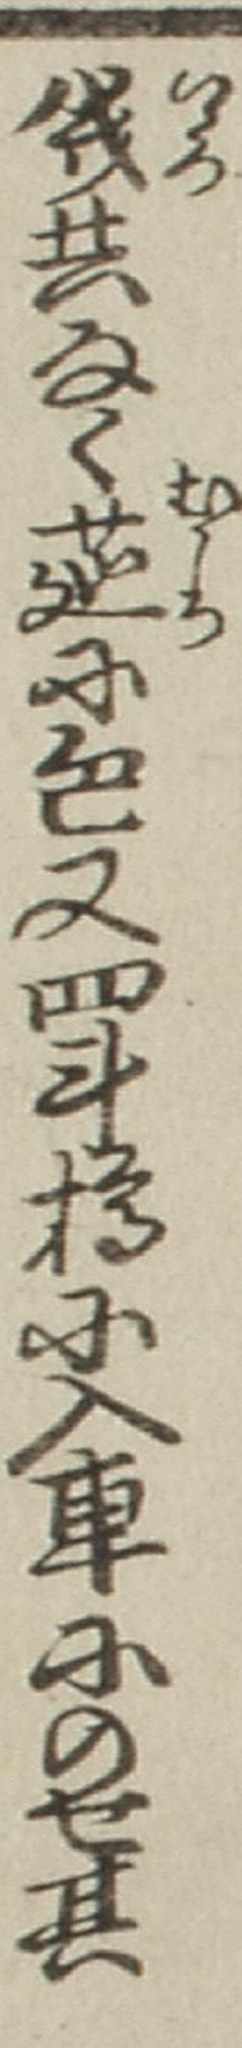幾共なく莚に包又四斗樽に入車にのせ其
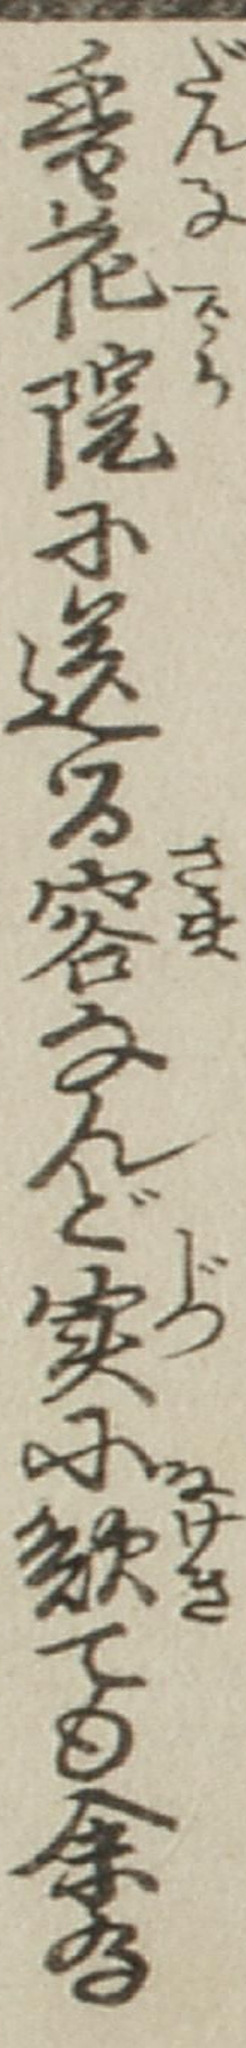香花院に送る容なんど実に歎ても余有
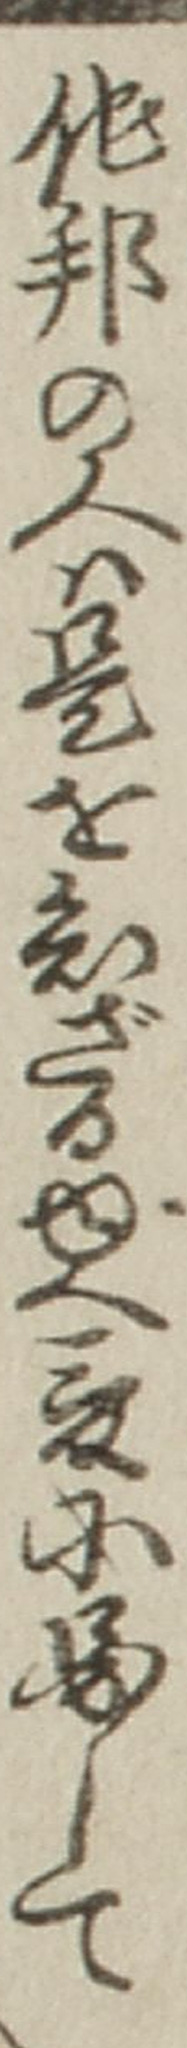他邦の人は是を知ざるゆへ爰に図して
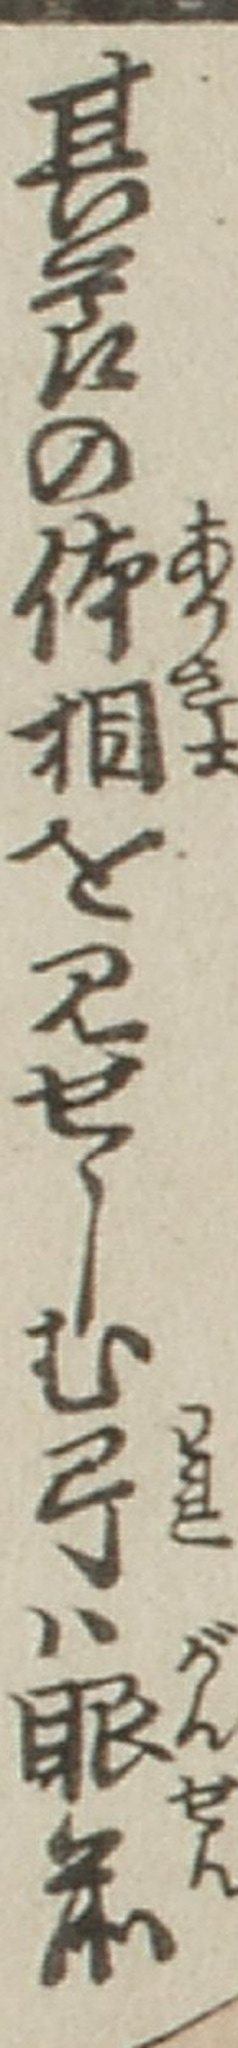其節の体相を見せしむ予は眼前
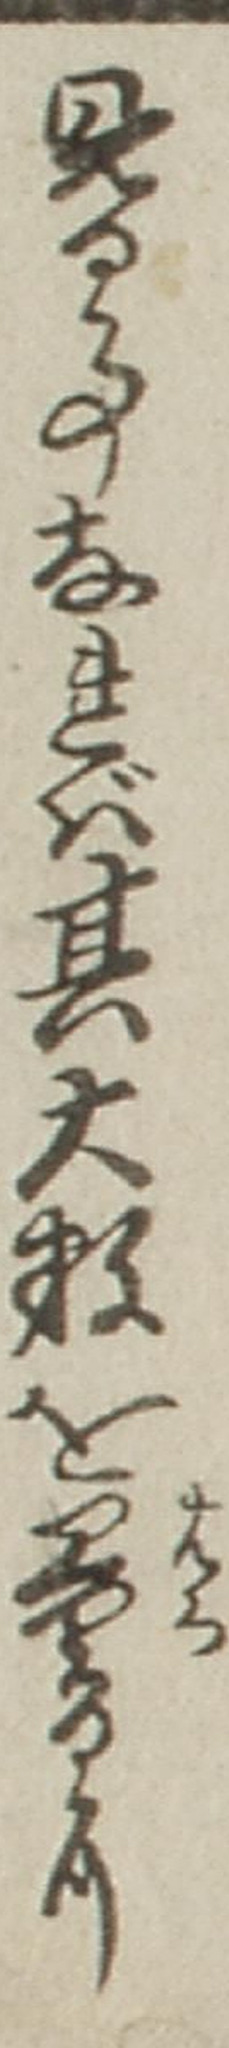見る事なれば其大数を量るに
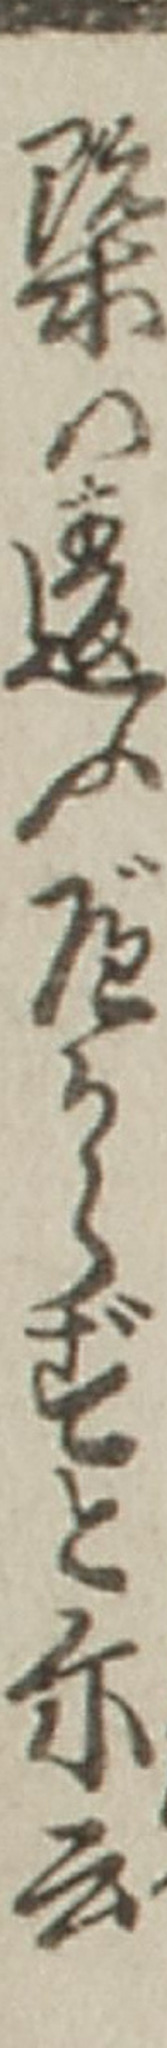概は違ふべからずと尓云一登斎
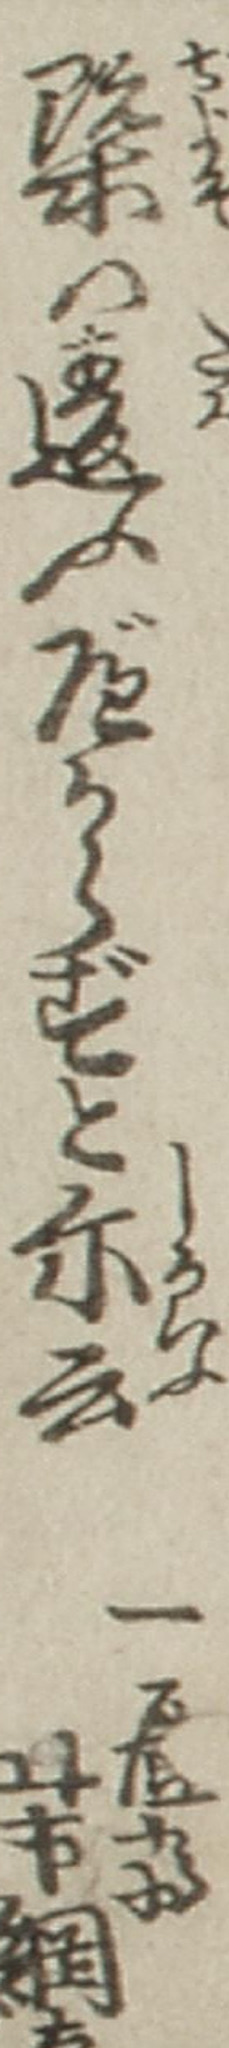概は違ふべからずと尓云一登斎

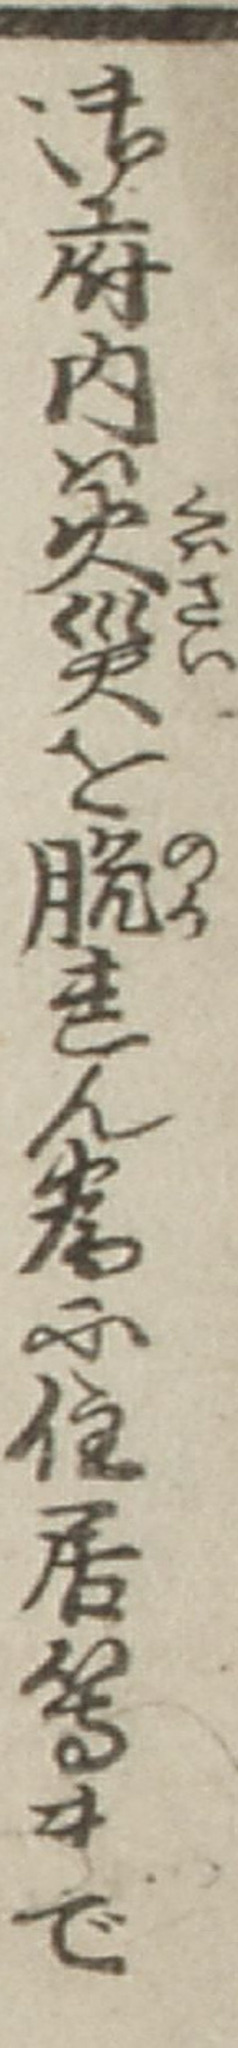御府内は火災を脱れん宿に住居等まで
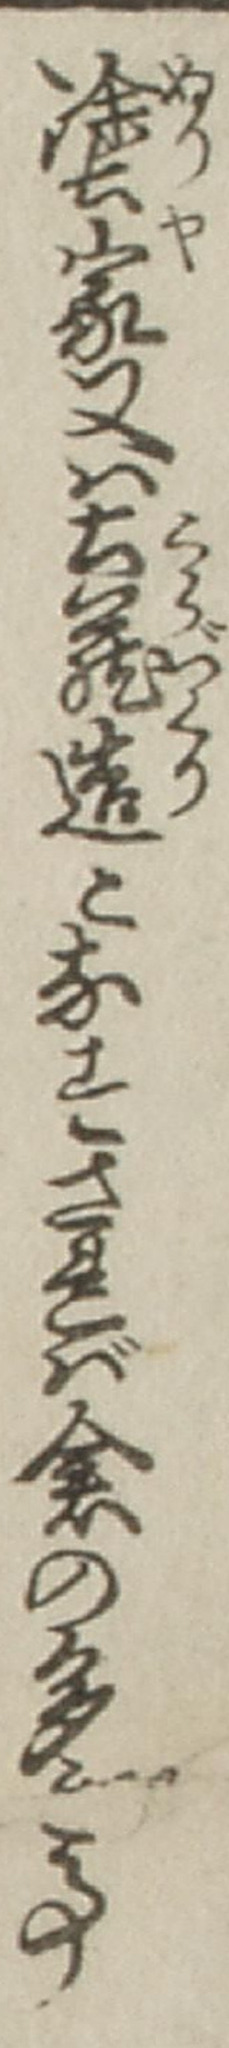塗家又は土蔵造になすされば倉の多き事
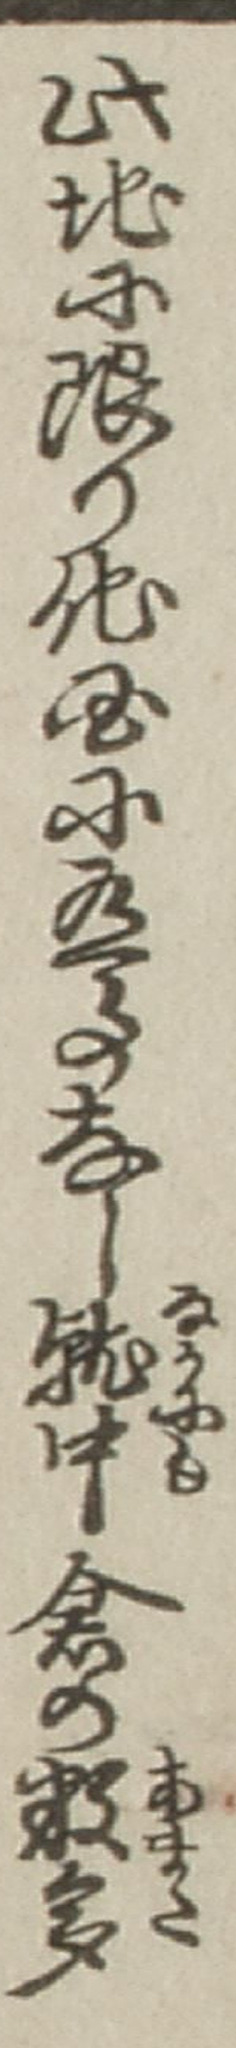此地に限り他国に有事なし就中倉の数多
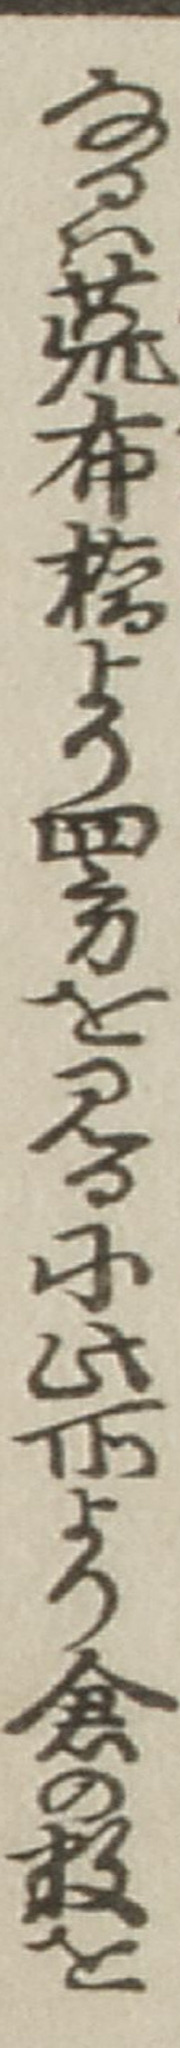なるは荒布橋より四方を見るに此所より倉の数を
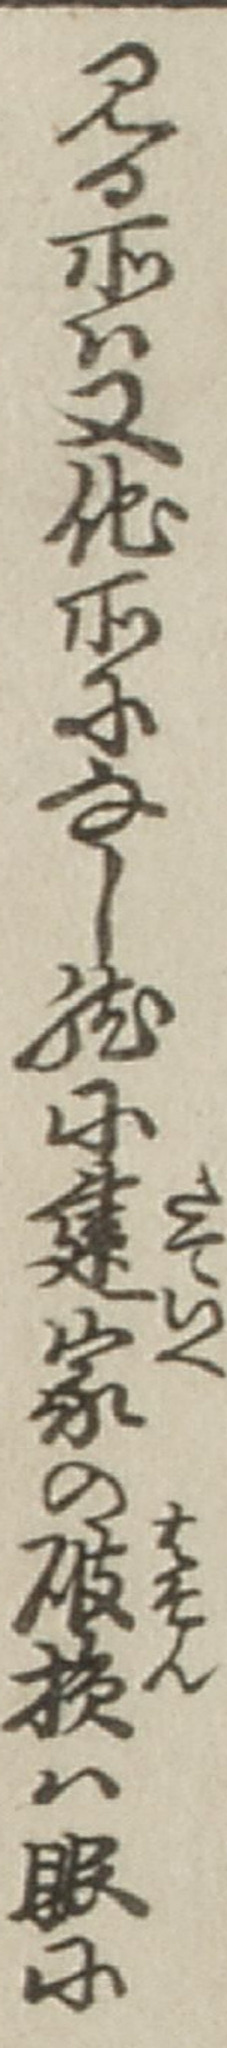見る所は又他所になし然に建家の破損は眼に
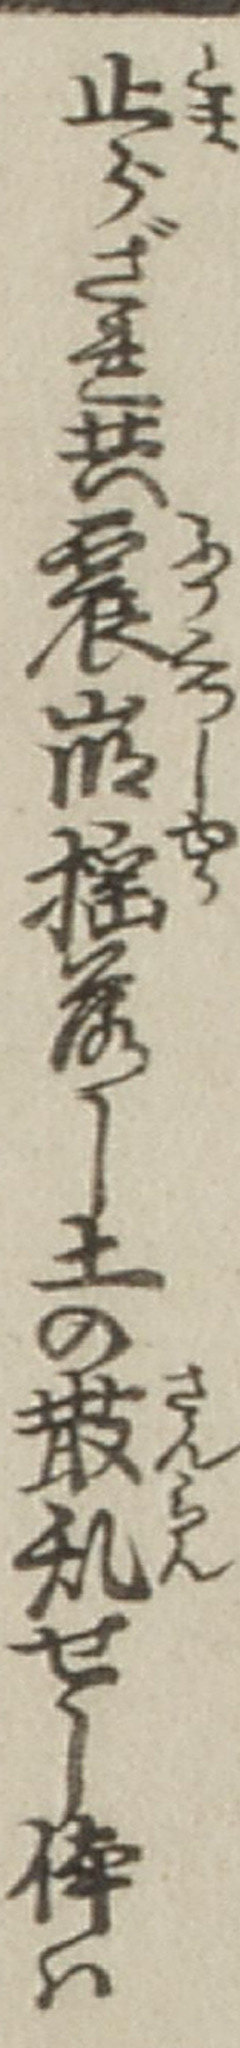止らざれ共震崩揺落し土の散乱せし体は
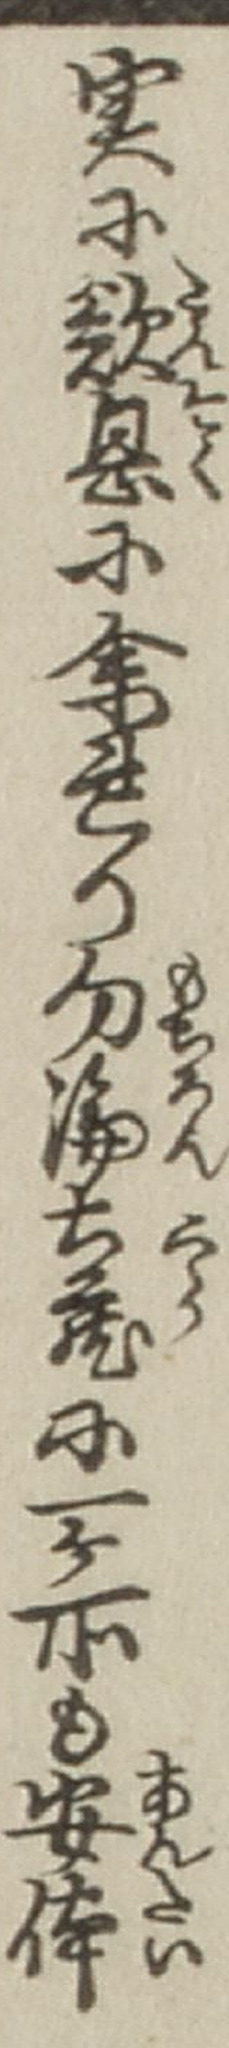実に歎息に余れり勿論土蔵に一ケ所も安体
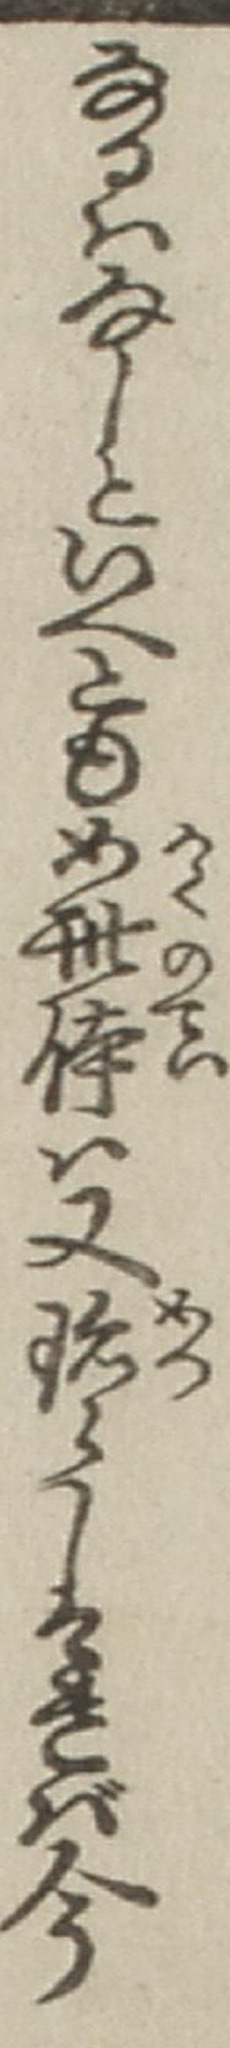なるはなしといへとも如此体は又珍らしければ今
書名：安政見聞誌　下
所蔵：東京大学地震研究所図書室 Earthquake Research Institute Library, The University of Tokyo, JAPAN
